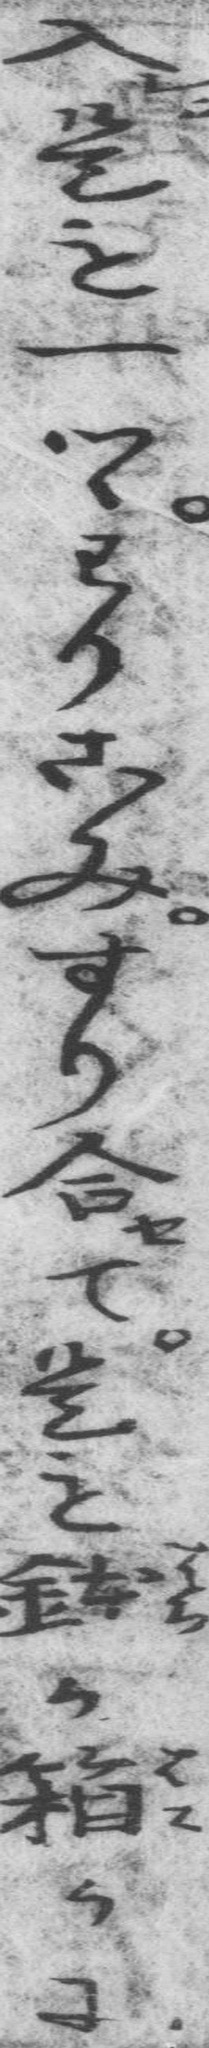入れ。是も一つゝ。わりこみ。すり合せて。是も鉢か箱かに
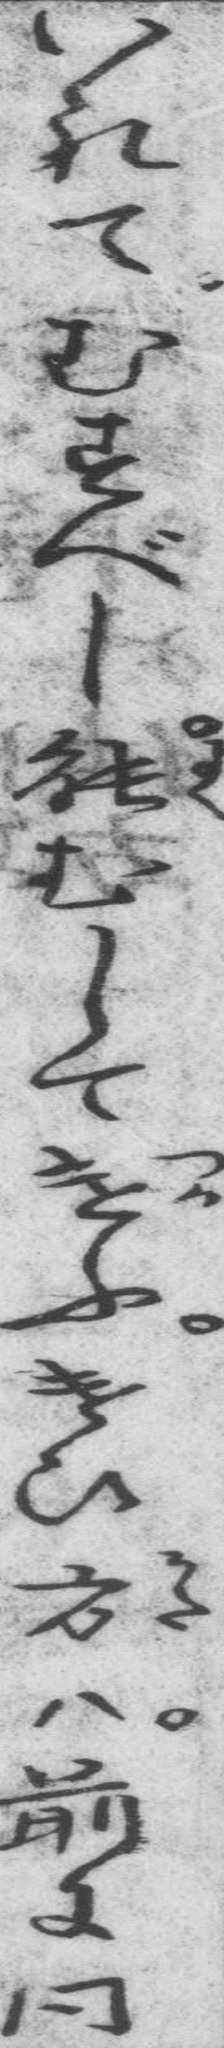いれて。むすべし。能むして遣ふ。遣ひ方は。前に同
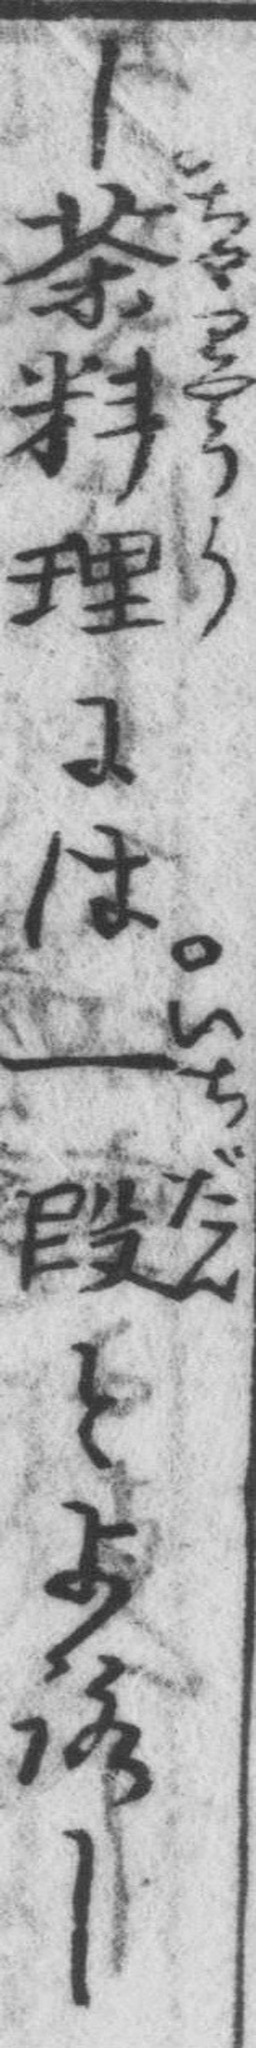し。茶料理には。一段とよろし
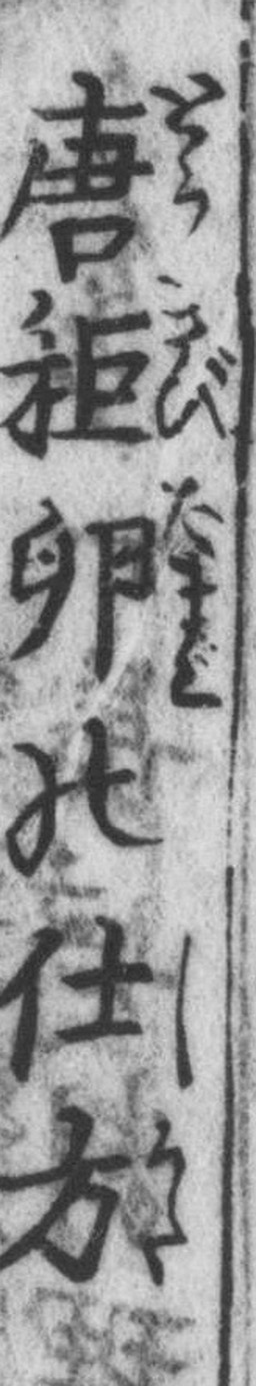唐秬卵の仕方
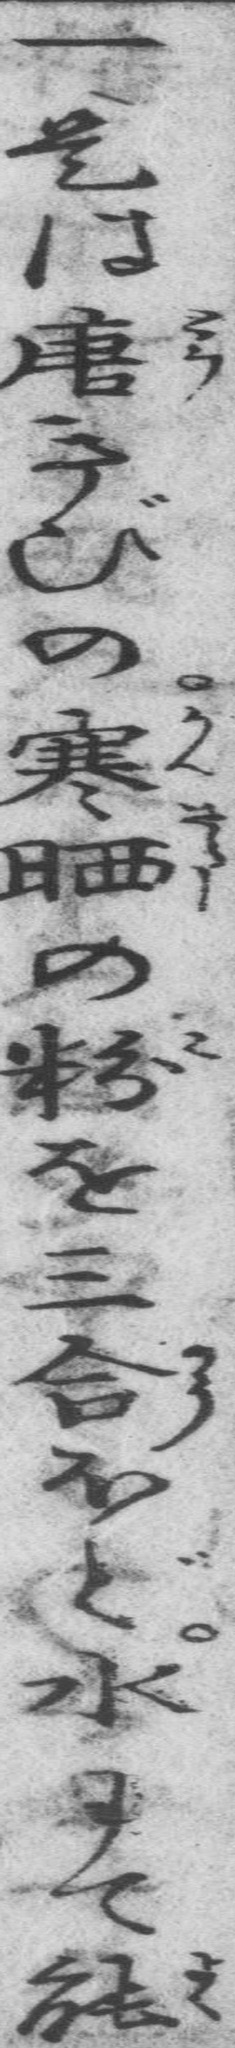一是は唐きびの。寒晒の粉を三合ほど。水にて能
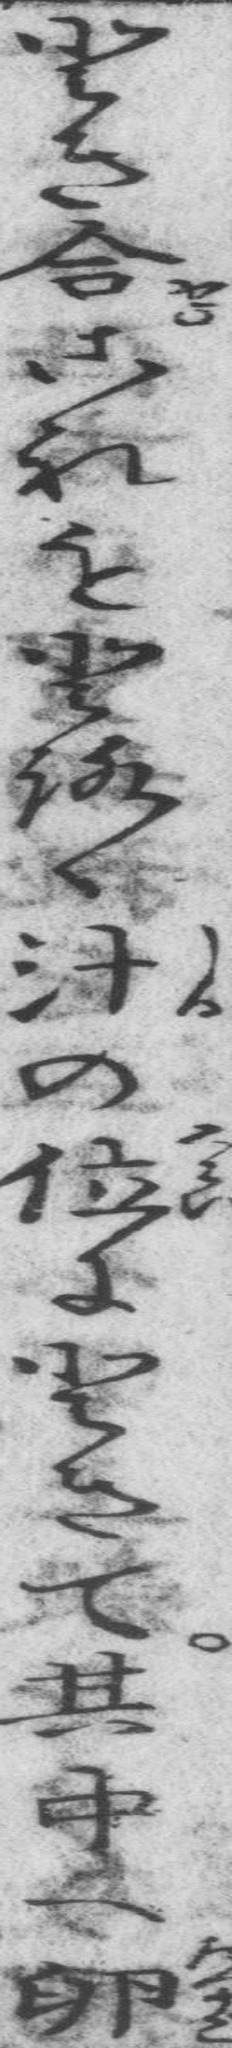とき合せ。これもとろゝ汁の位にときて。其中へ卵
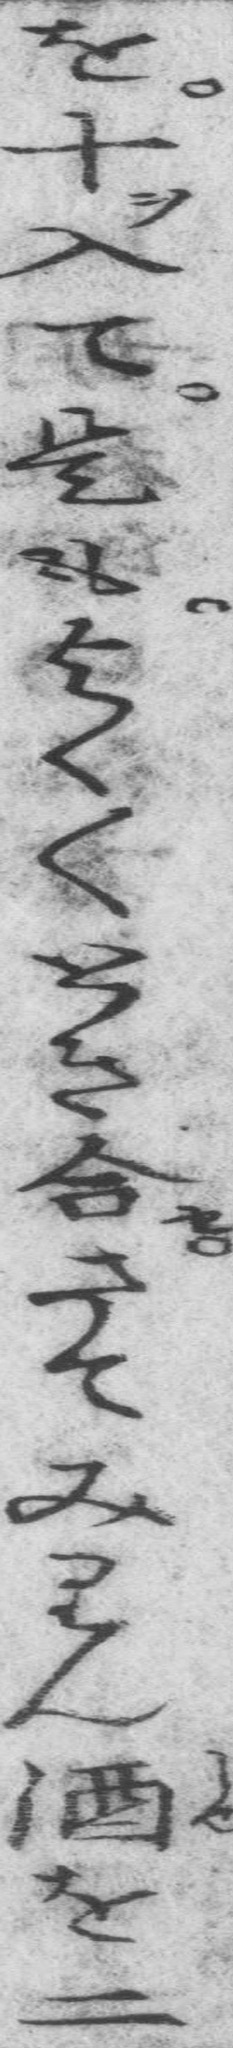を。十ヲ入て。是も。よく〳〵とき合せ。さてみりん酒を二
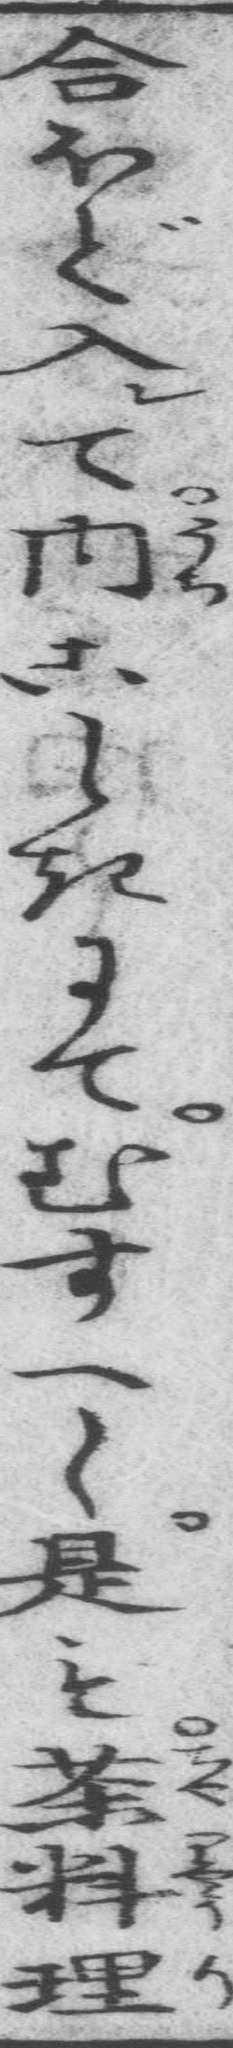合ほど入れて。内こしきにて。むすへし。是も。茶料理
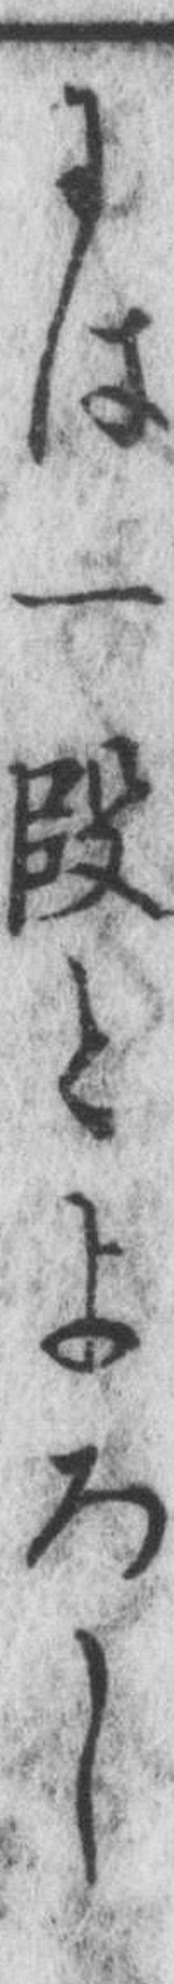には。一段とよろし
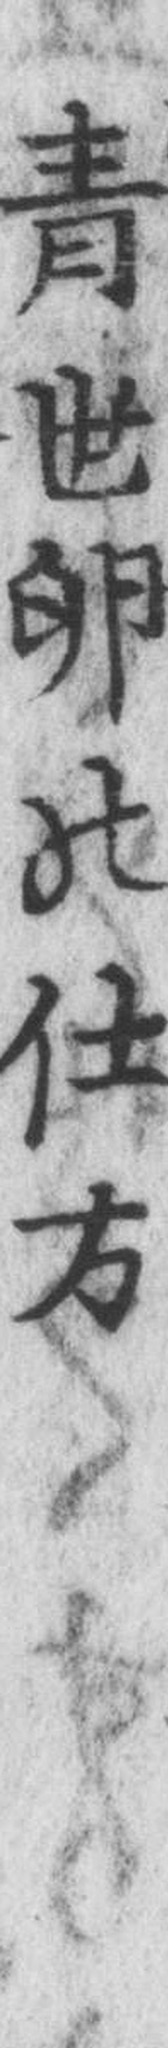青世卵の仕方
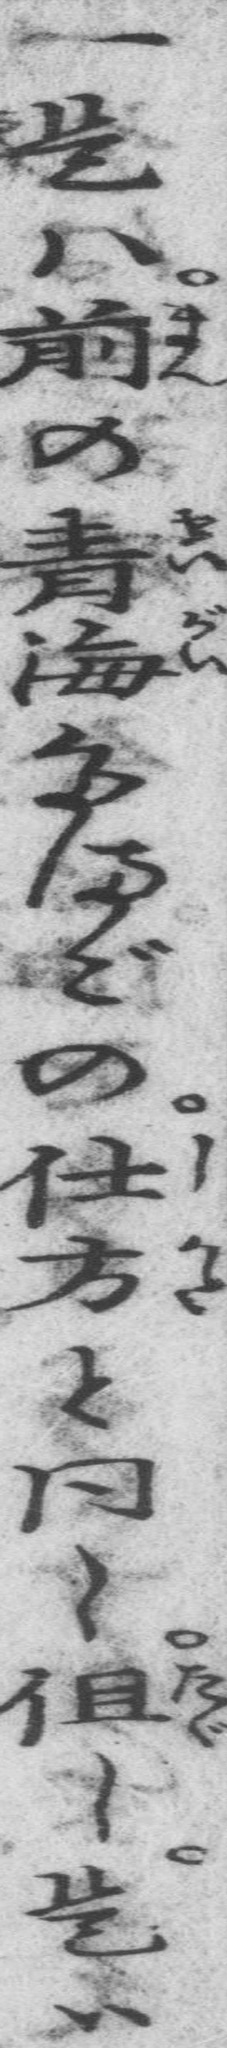一是は。前の青海たまごの。仕方と同し。但し。是は
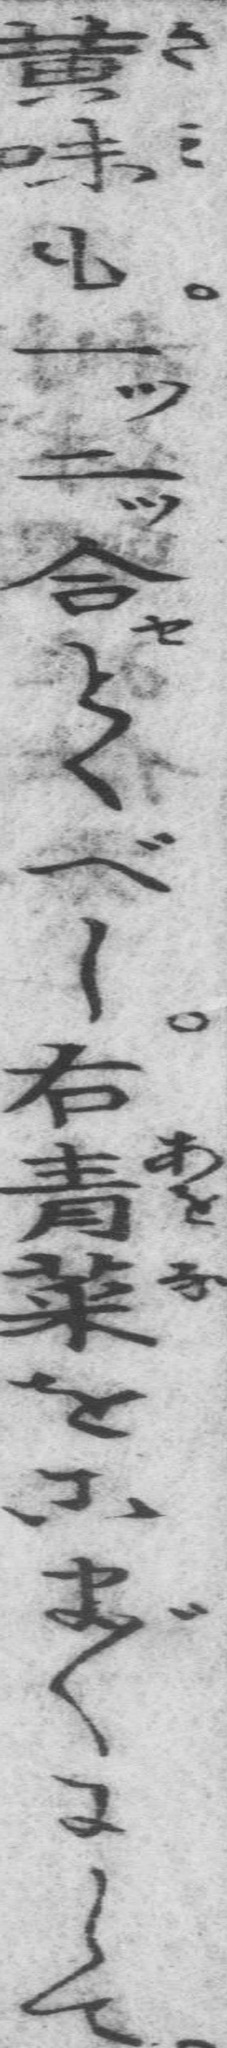黄味も。一つ二つ合せとくべし。右青菜をこま〴〵にして。
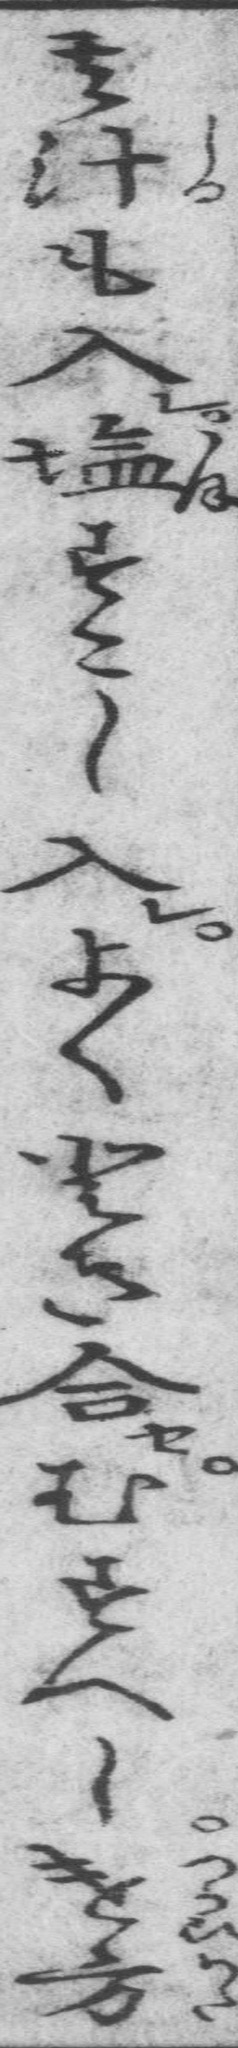其汁も入れ。塩すこし入れ。よくとき合せ。むすへし。遣方

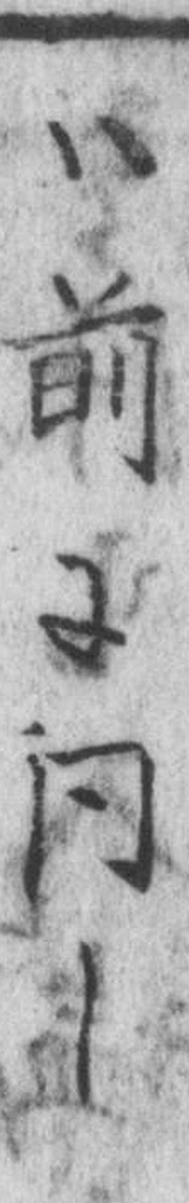は前に同し
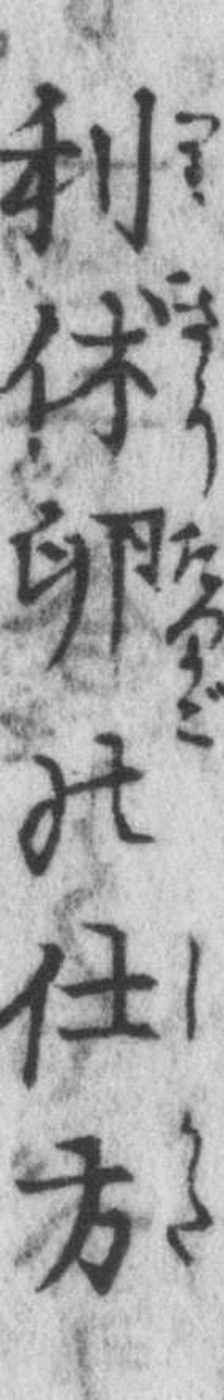利休卵の仕方
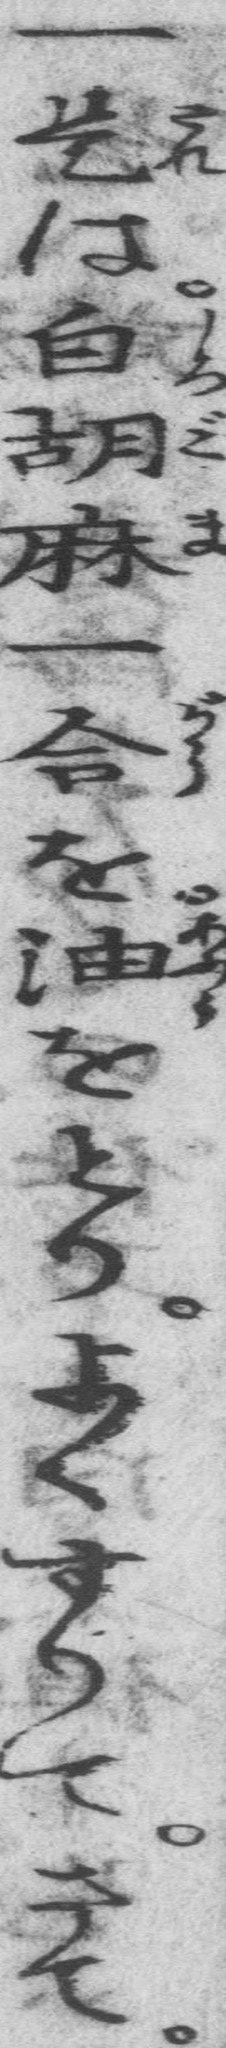一是は。白胡麻一合を。油をとり。よくすりて。さて。
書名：萬寳料理秘密箱
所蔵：大阪府立大学学術情報センター 国文学研究資料館
